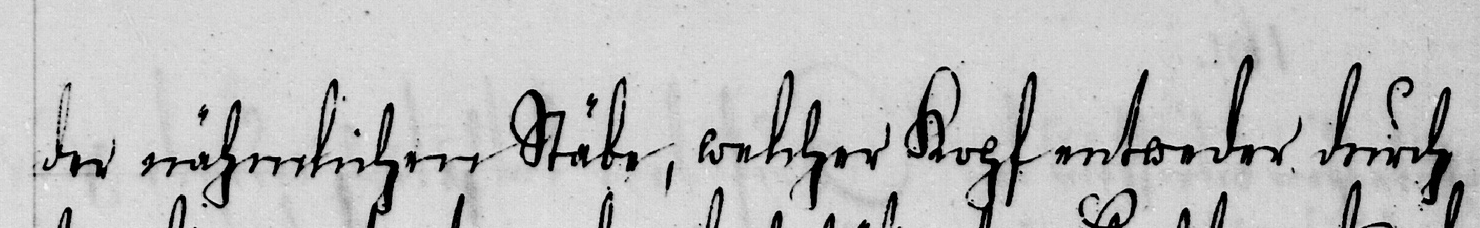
der nähmlichen Stäbe, welcher Kopf entweder durch
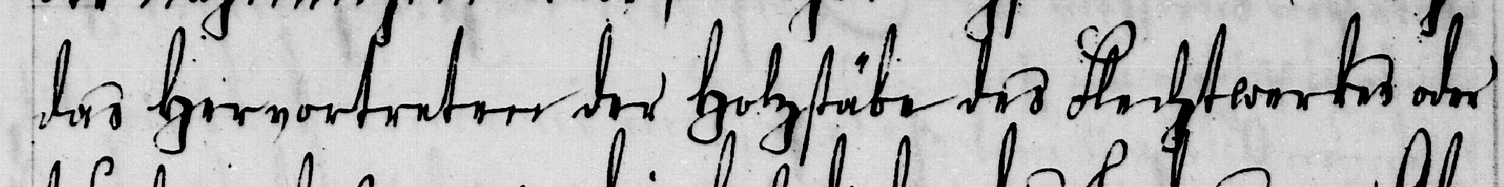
das Hervortreten der Holzstäbe des Flechtwerkes oder
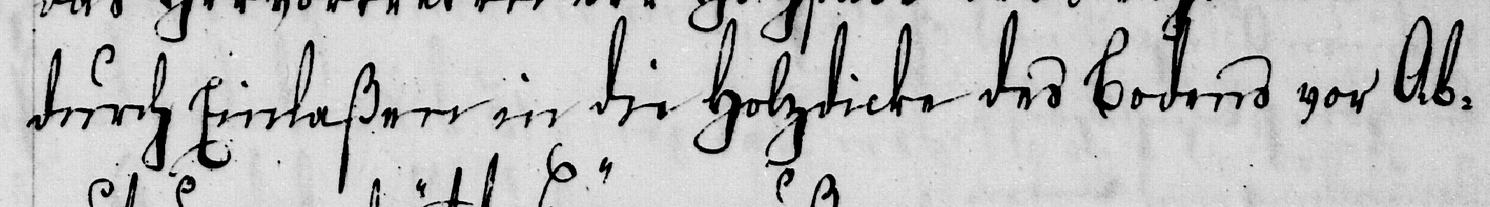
durch Einlaßen in die Holzdicke des Bodens vor Ab¬
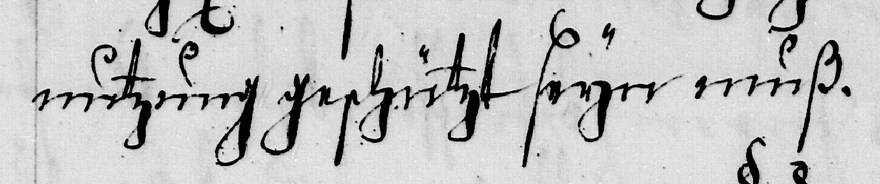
nutzung geschützt seyn muß.
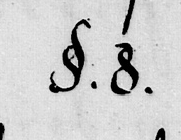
§. 9.
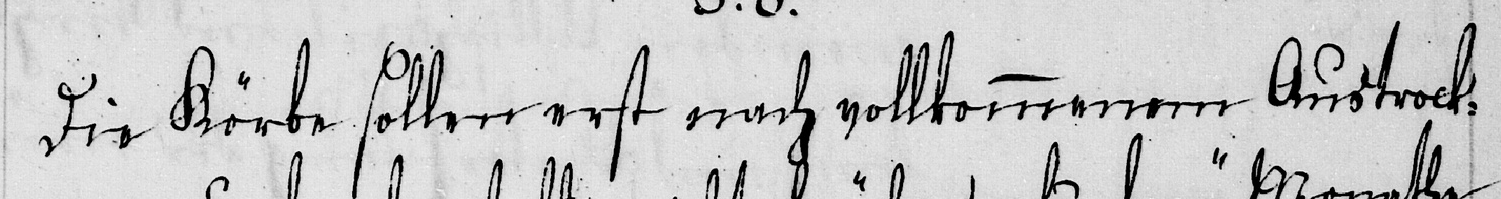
Die Körbe sollen erst nach vollkommenem Austrock¬
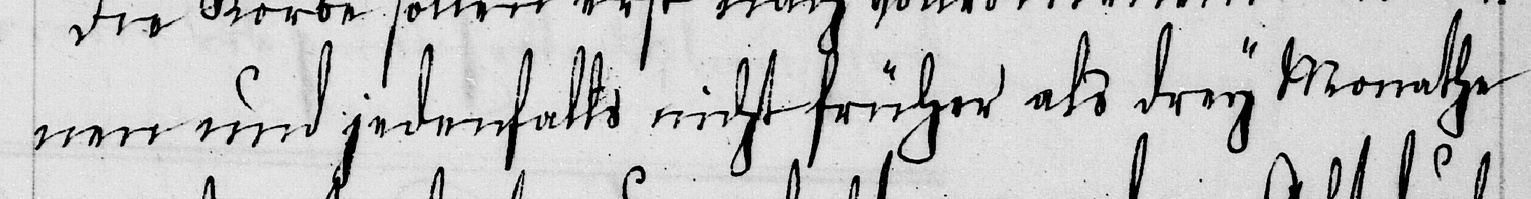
nen und jedenfalls nicht früher als drey Monathe
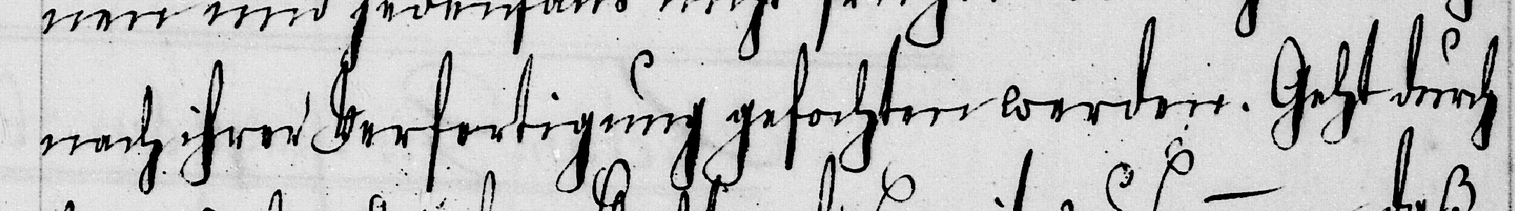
nach ihrer Verfertigung gefochten werden. Geht durch
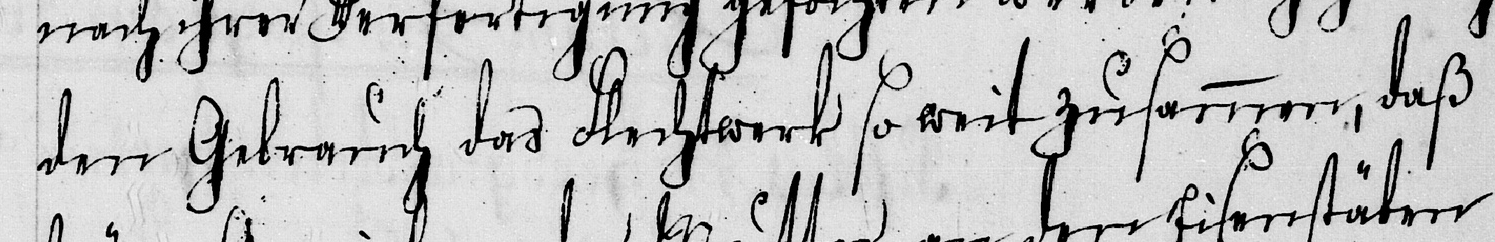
den Gebrauch das Flechtwerk so weit zusammen, daß
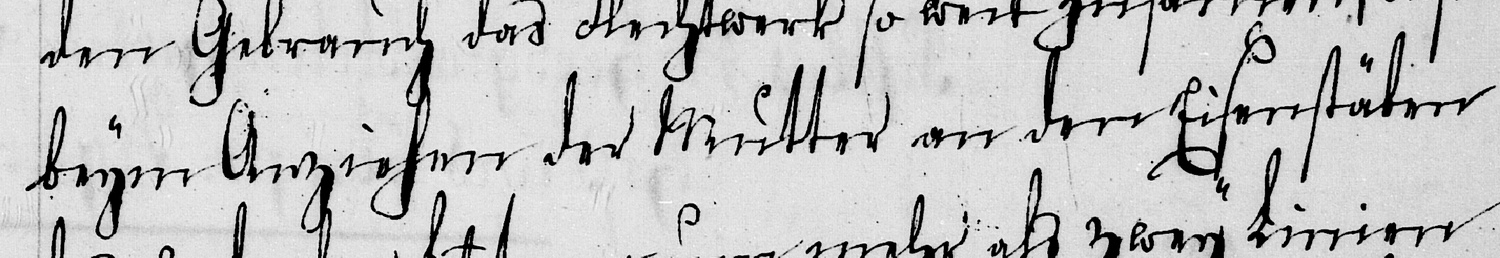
beym Anziehen der Mutter an den Eisenstäben
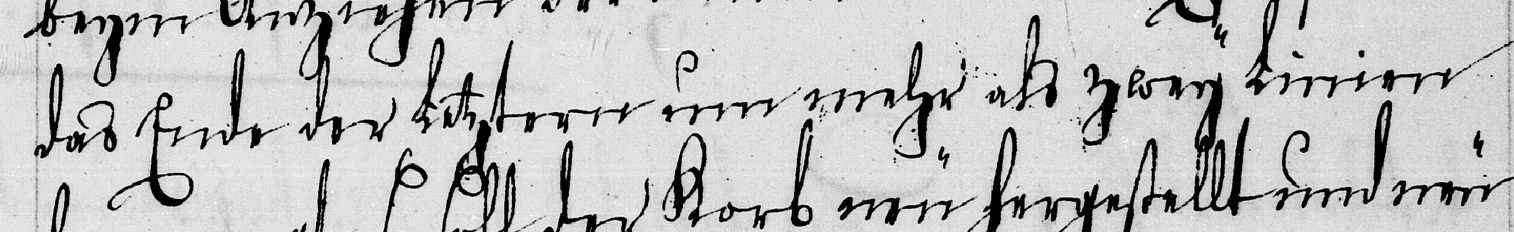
das Ende der Letztern um mehr als zwey Linien
